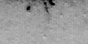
dem
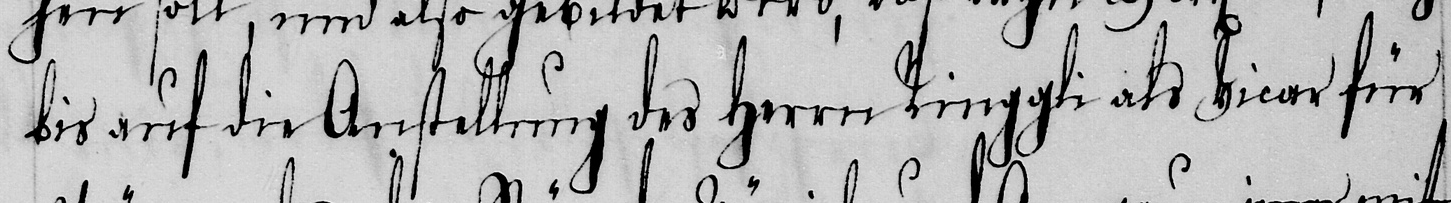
bis auf die Anstellung des Herrn Ringgli als Vicar für
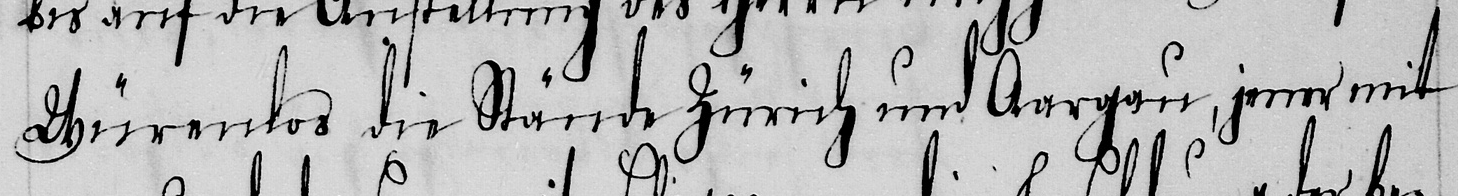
Würenlos die Stände Zürich und Aargau, jener mit
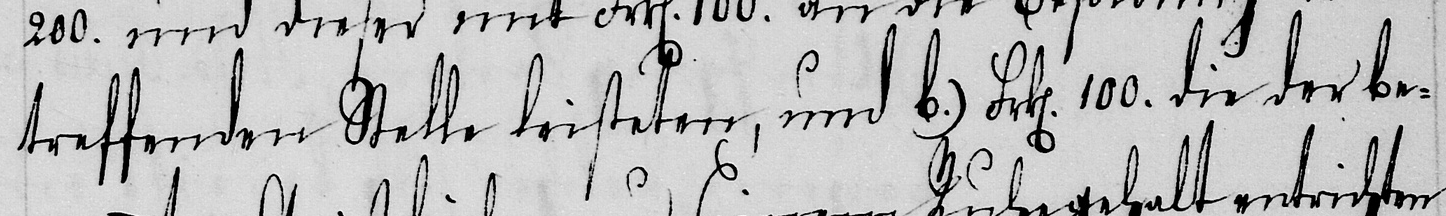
treffenden Stelle leisteten, und b.) Frk[e¬
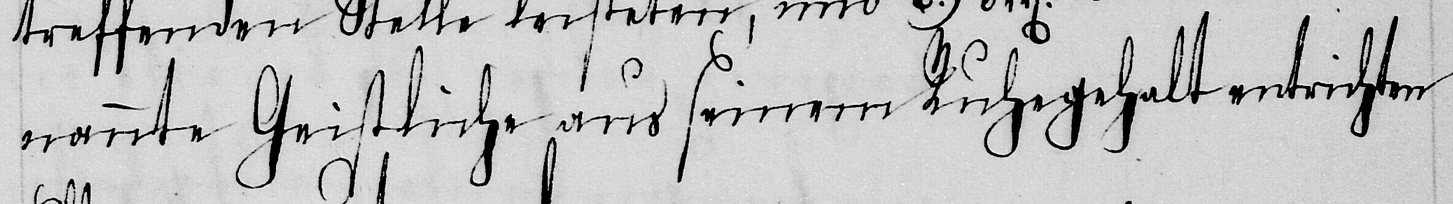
nannte Geistliche aus seinem Ruhegehalt entrichten
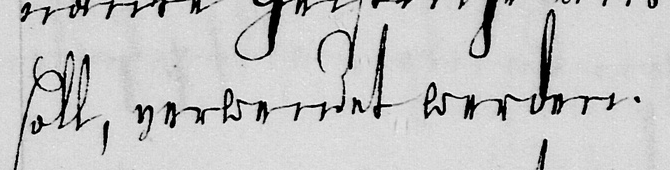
soll, verwendet werden.
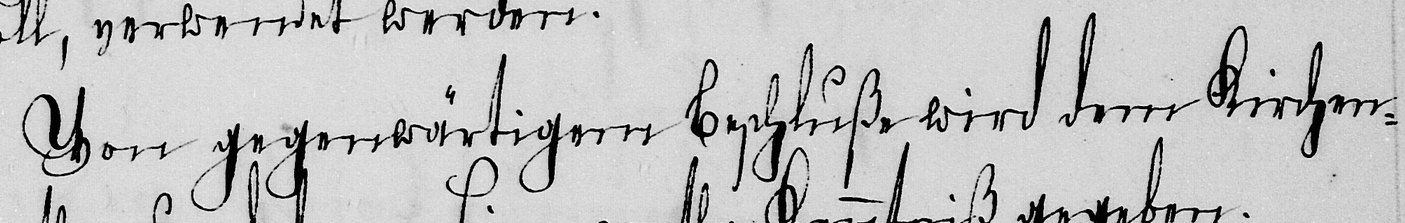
Von gegenwärtigem Beschluße wird dem Kirchen¬
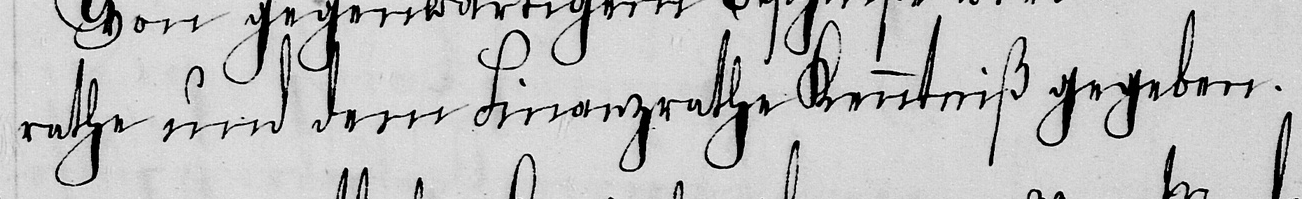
rathe und dem Finanzrathe Kenntniß gegeben.
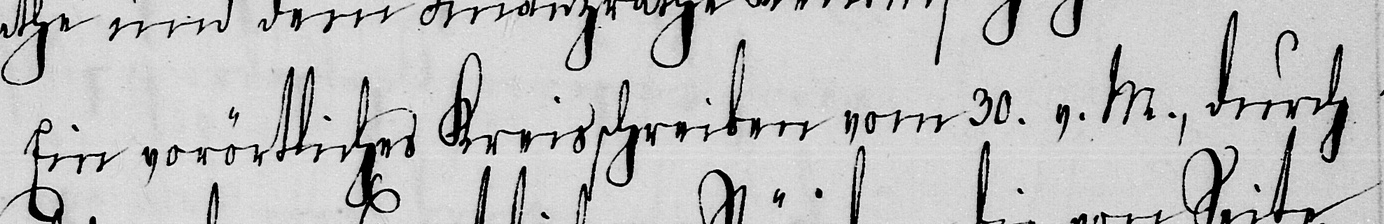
Ein vorörtliches Kreisschreiben vom 30. v. M., durch
